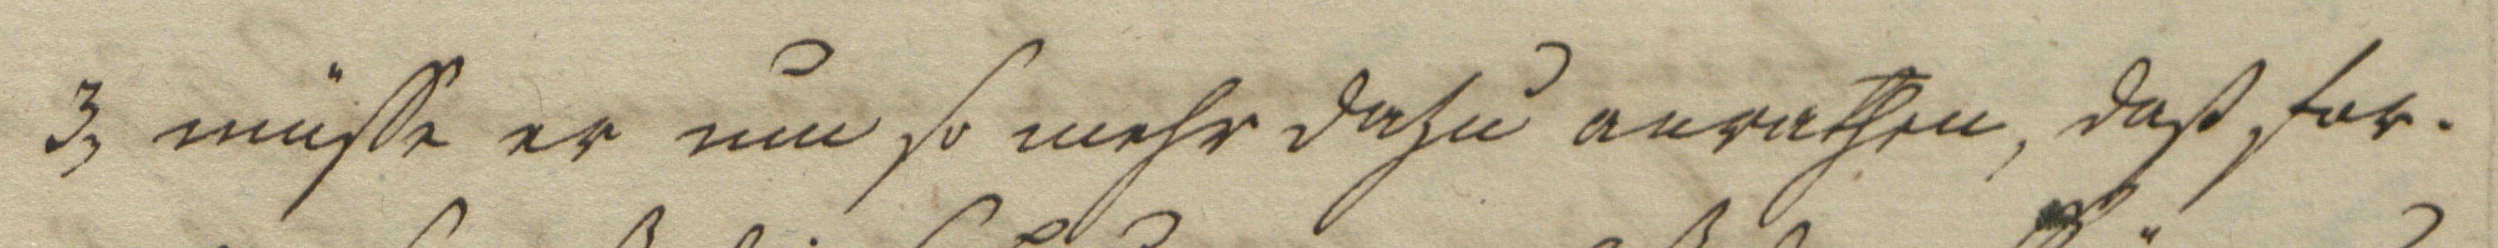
3., müsse er um so mehr dazu anrathen, daß for¬
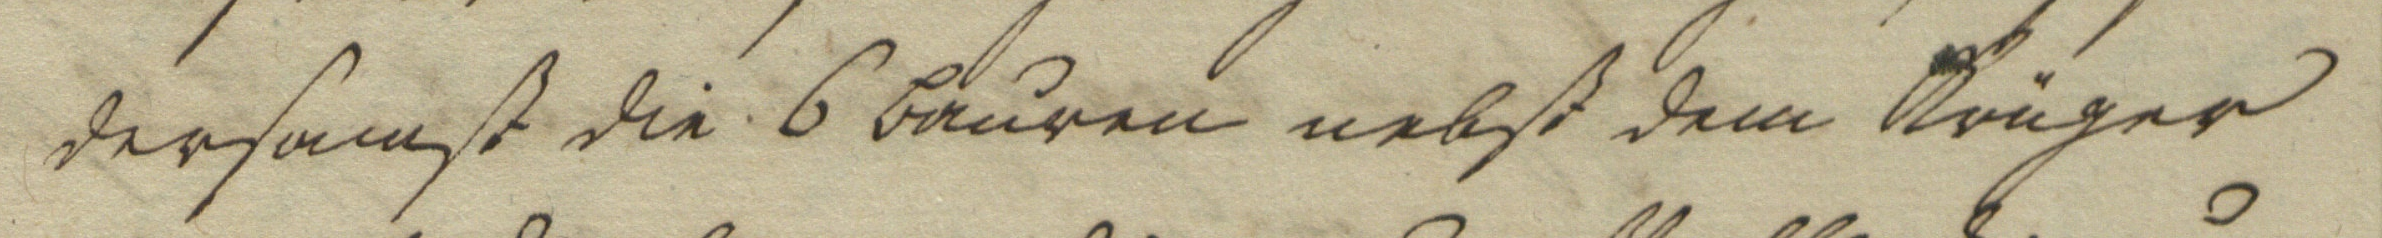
dersamst die 6 Bauren nebst dem Krüger
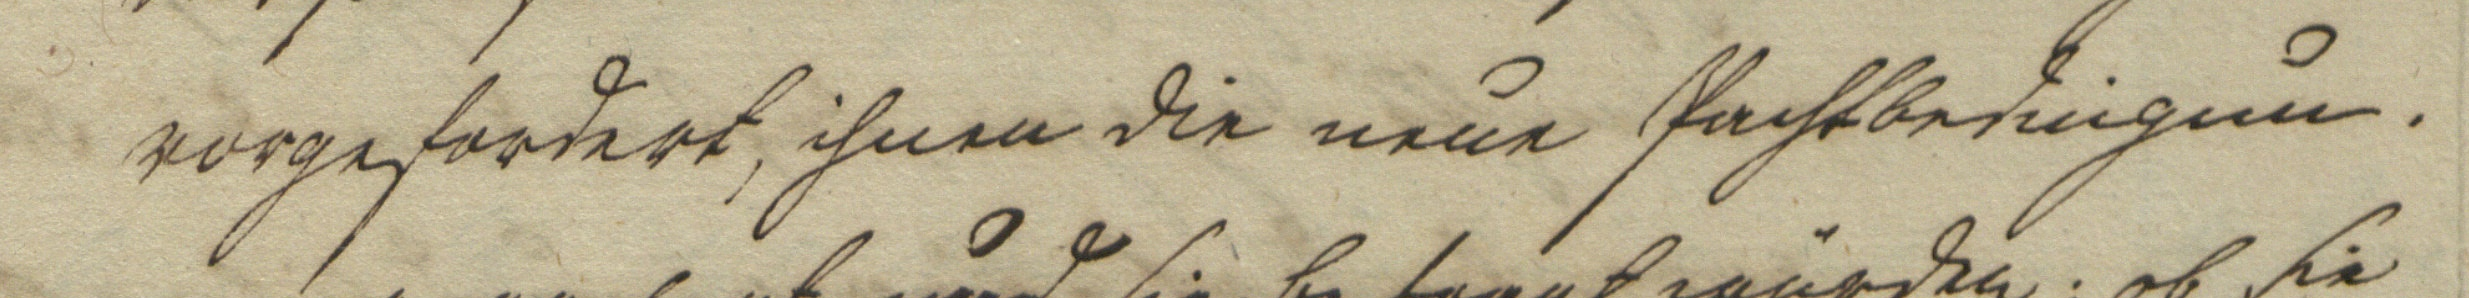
vorgefordert, ihnen die neue Pachtbedingun¬
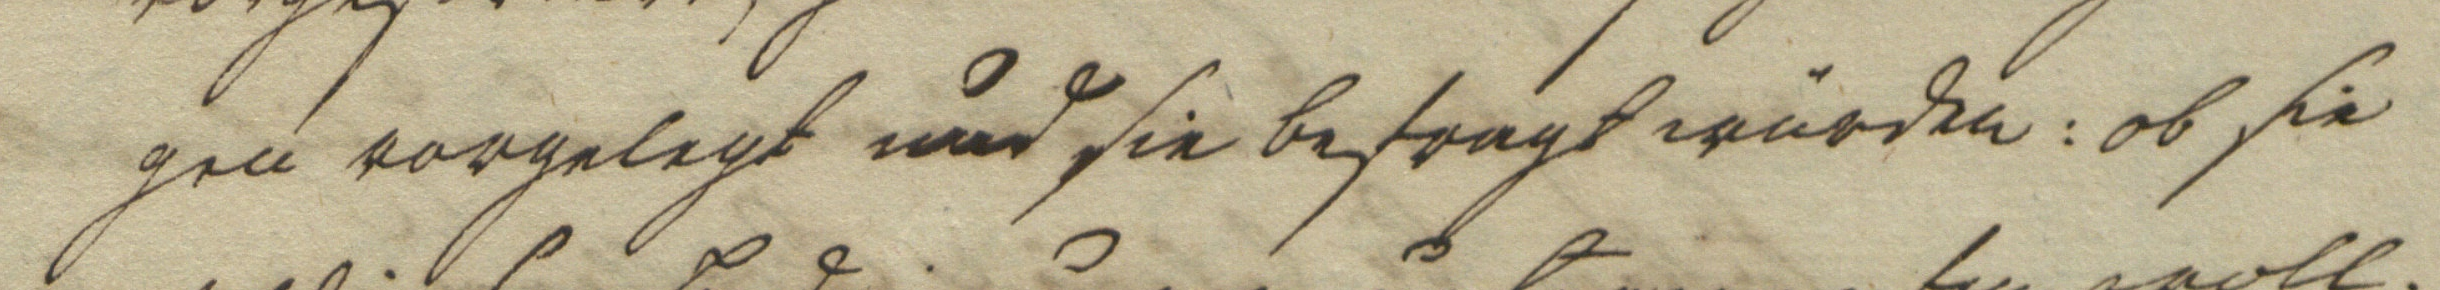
gen vorgelegt und sie befragt würden: ob sie
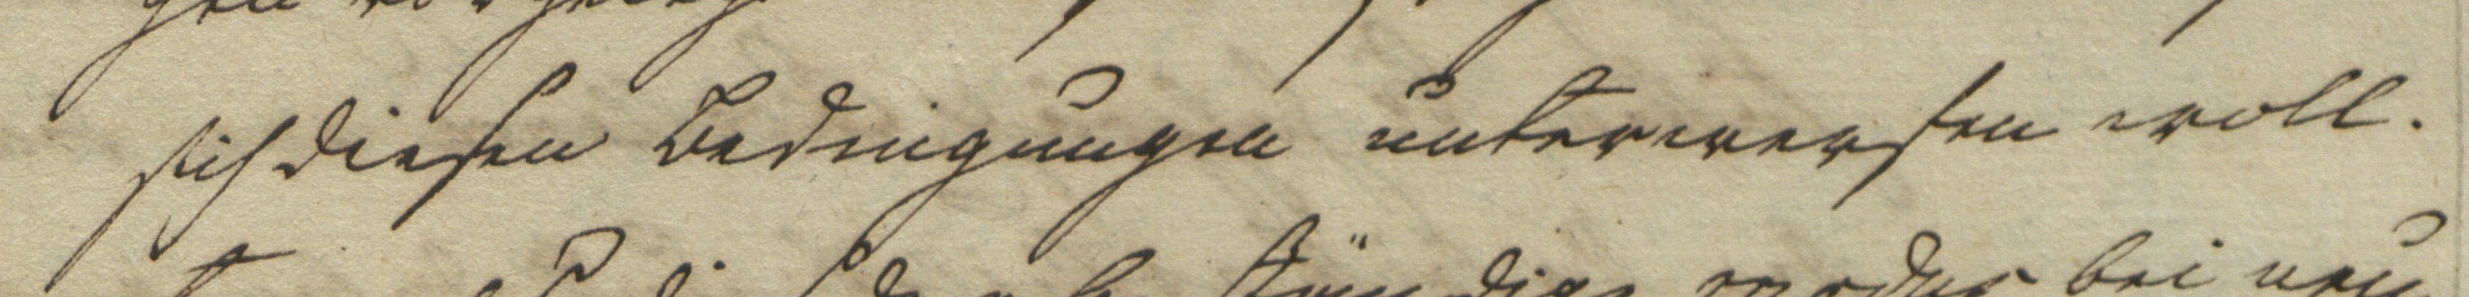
sich diesen Bedingungen unterwerfen woll¬
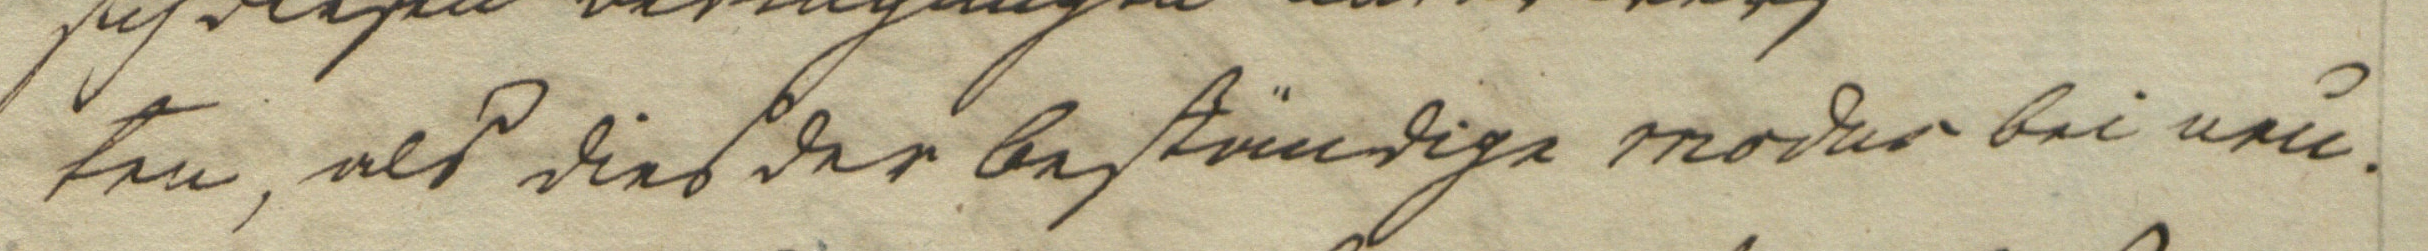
ten, als dies der beständige modus bei neu¬
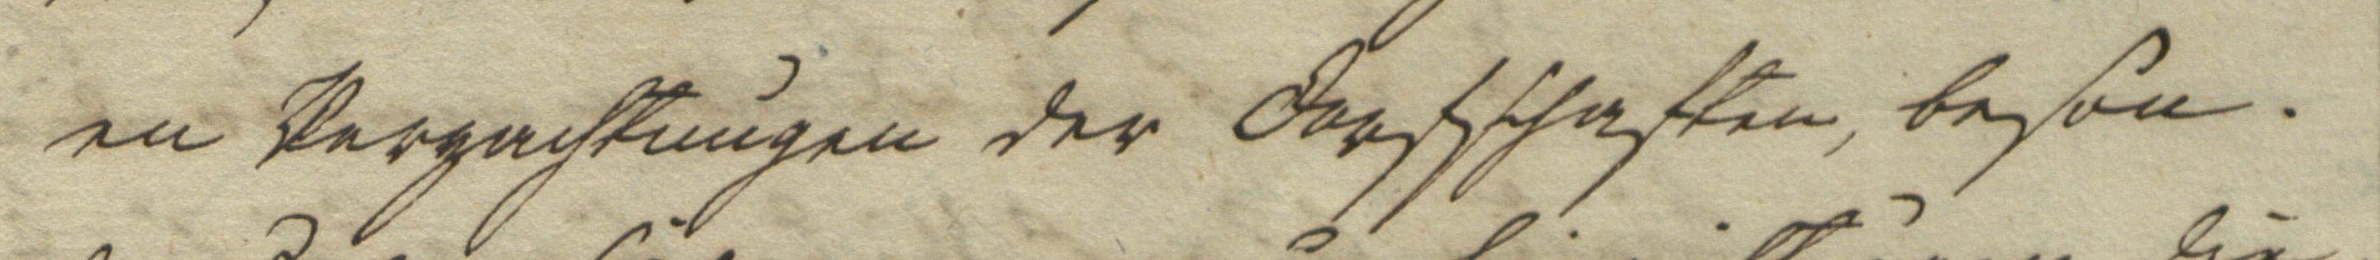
en Verpachtungen der Dorfschaften, beson¬
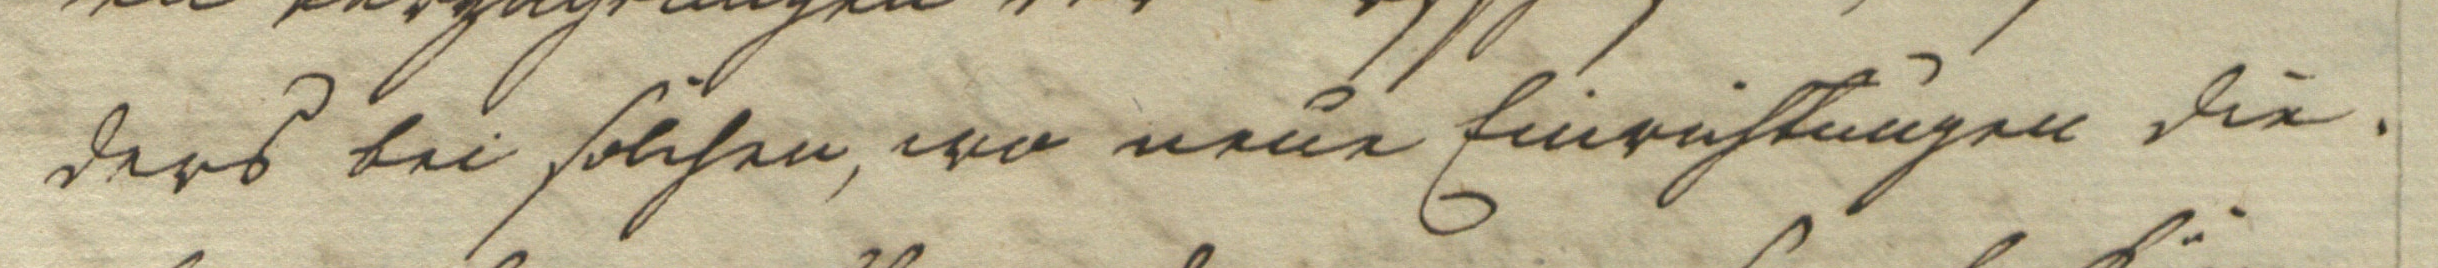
ders bei solchen, wo neue Einrichtungen die¬
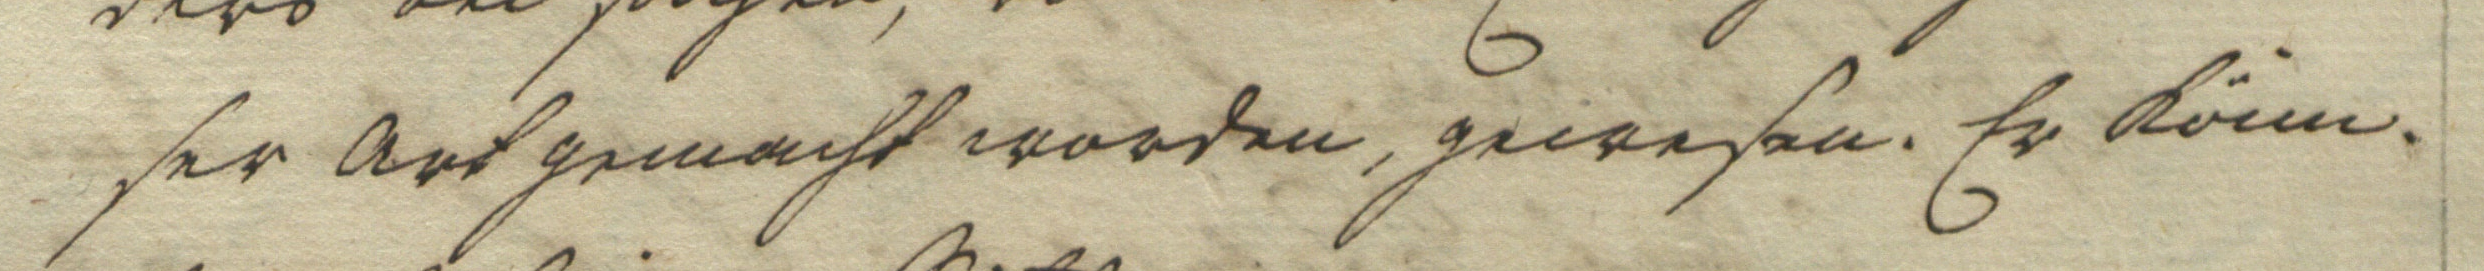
ser Art gemacht worden, gewesen. Er könn¬
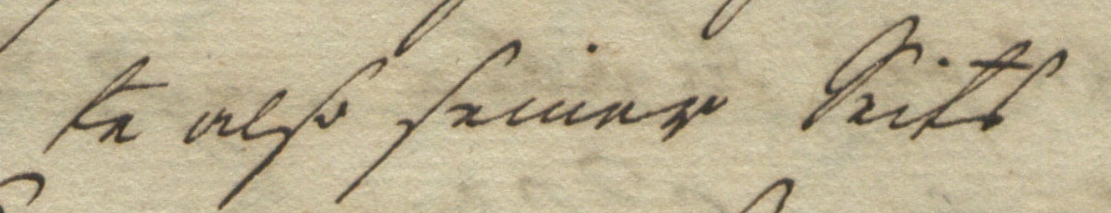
te also seiner Seits.
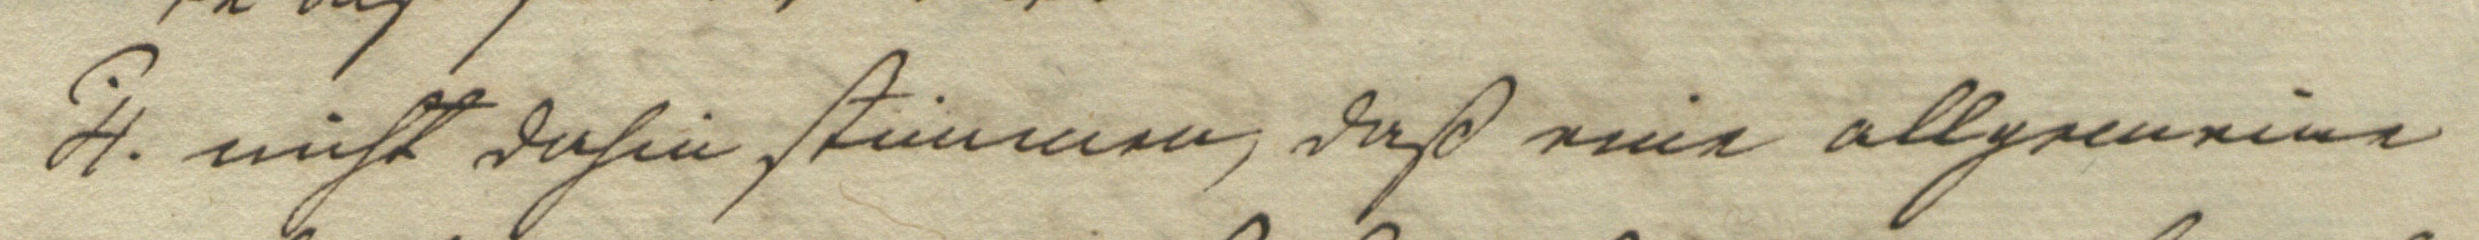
4. nicht dahin stimmen, daß eine allgemeine
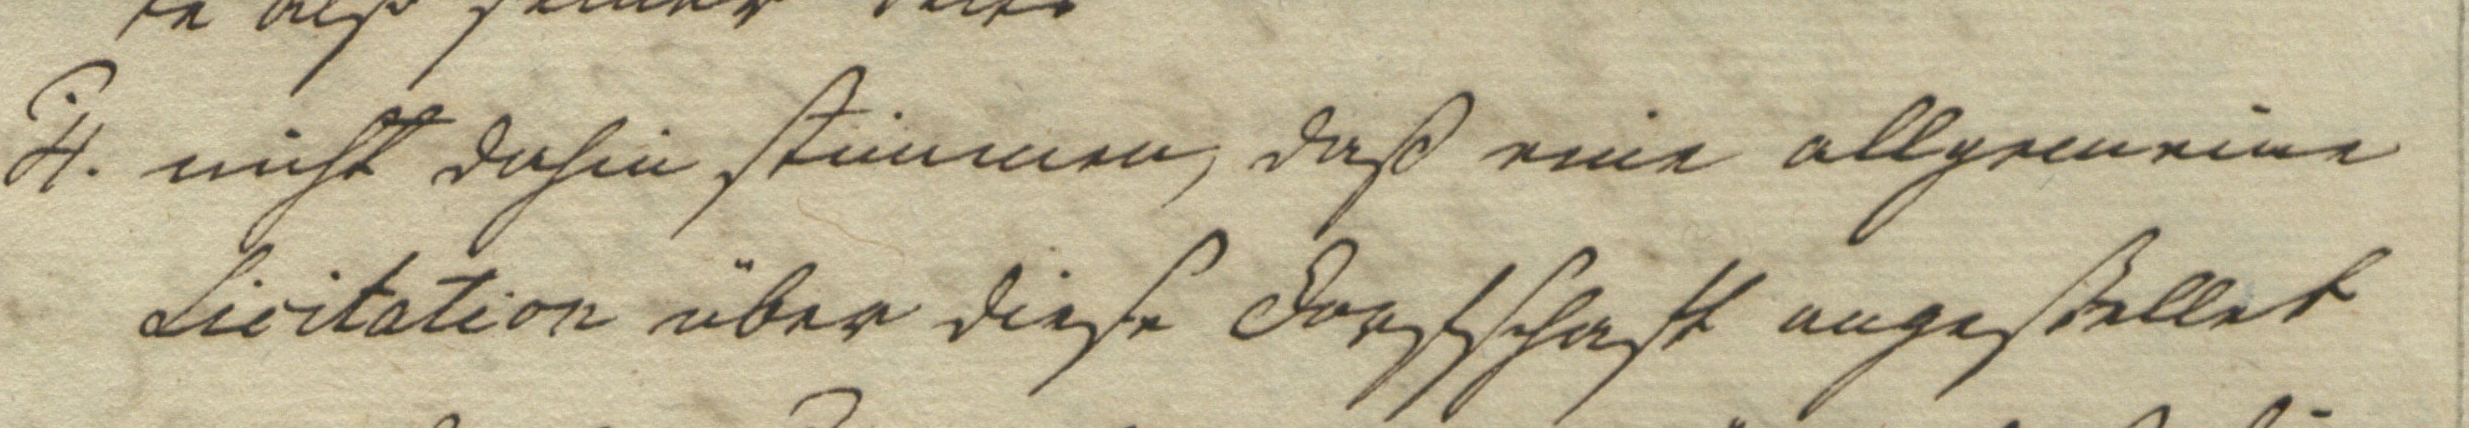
Licitation über diese Dorfschaft angestellet
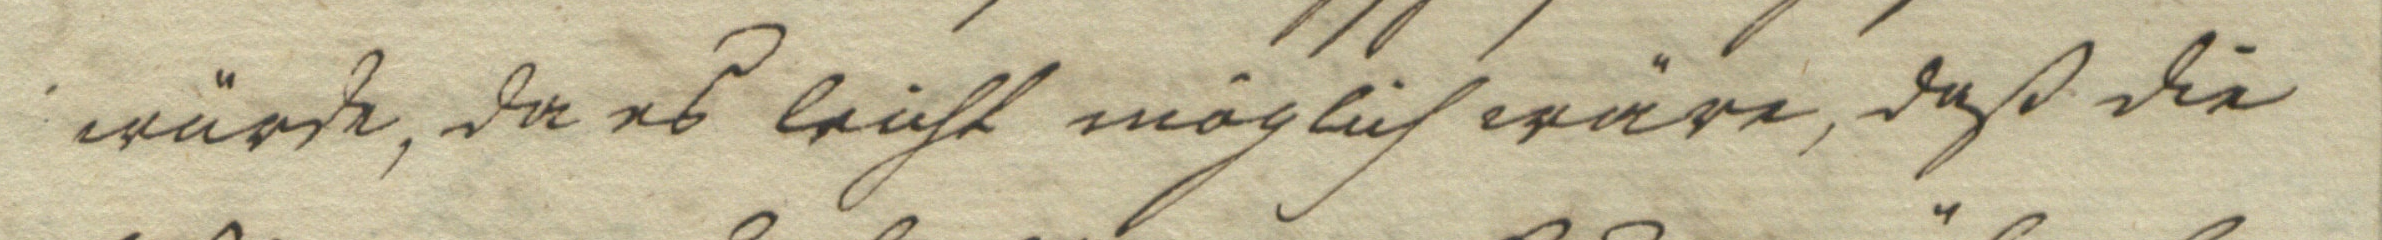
würde, da es leicht möglich wäre, daß die
